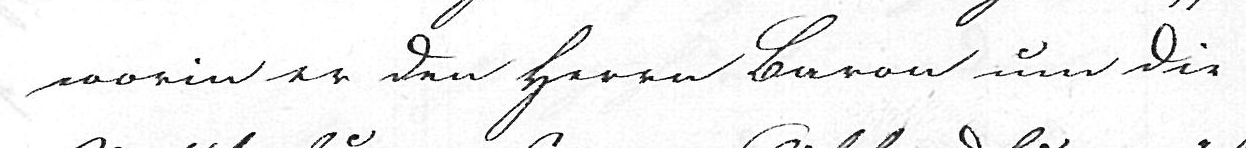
worin er den Herrn Baron um die
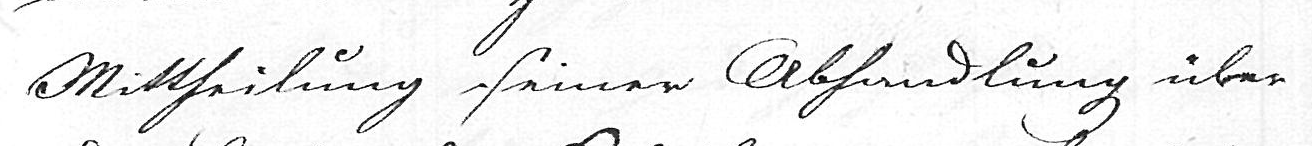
Mittheilung seiner Abhandlung über
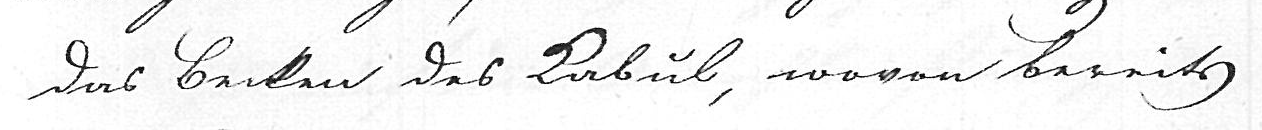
das Becken des Kabul, wovon bereits
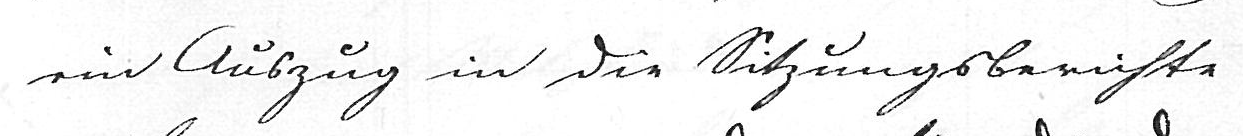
ein Auszug in die Sitzungsberichte
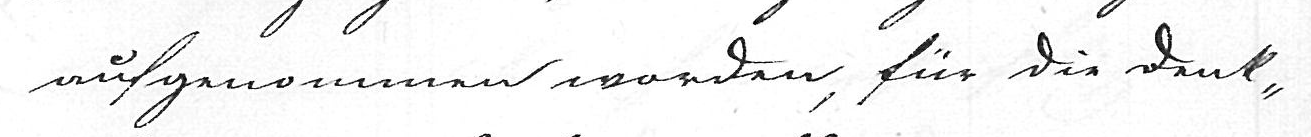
aufgenommen worden, für die Denk-
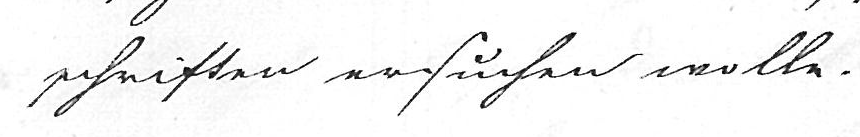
schriften ersuchen wolle.
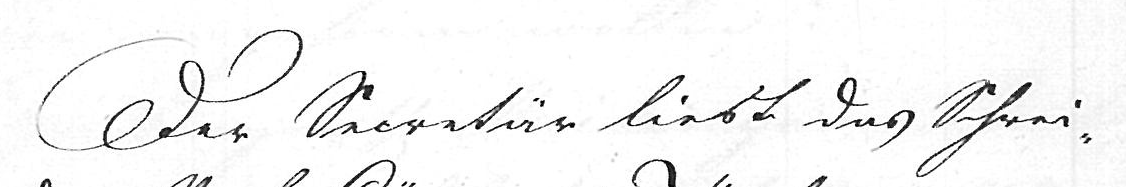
Der Secretär liest das Schrei-
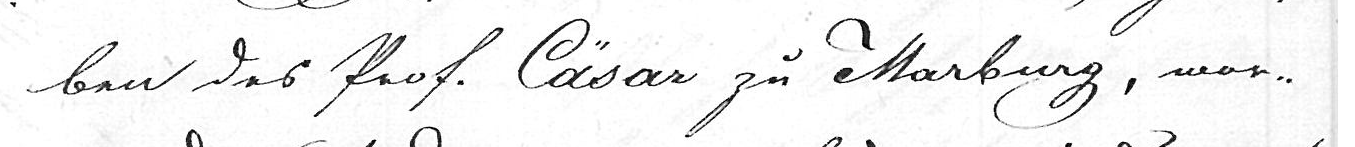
ben des Prof. Cäsar zu Marbng, wor-
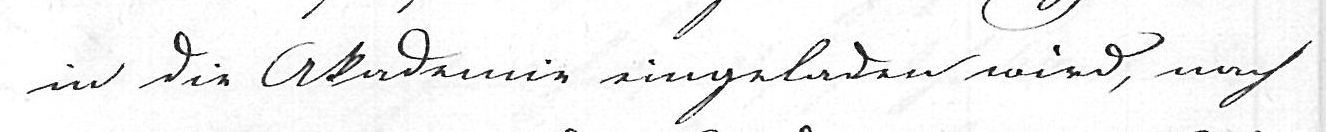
in die Akademie eingeladen wird, nach
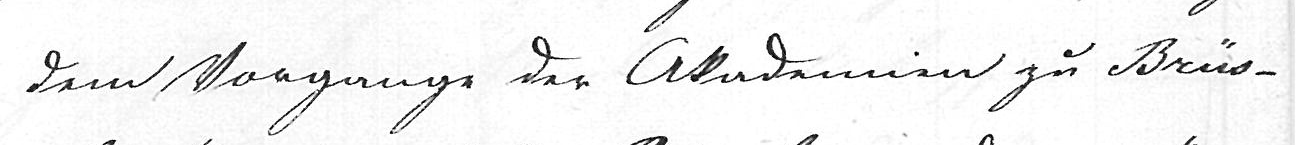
dem Vorgange der Akademien zu Brüs-
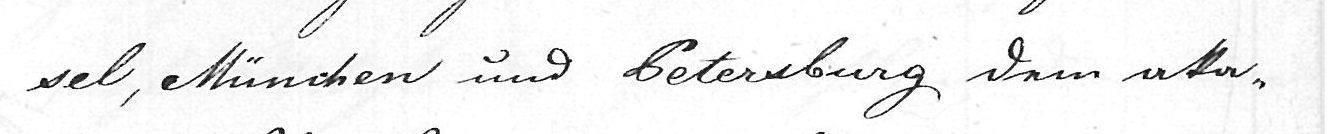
sel, München und Petersburg dem aka-
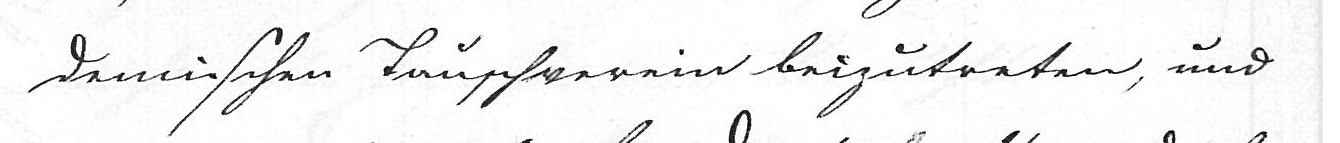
demischen Tauschverein beizutreten, und
